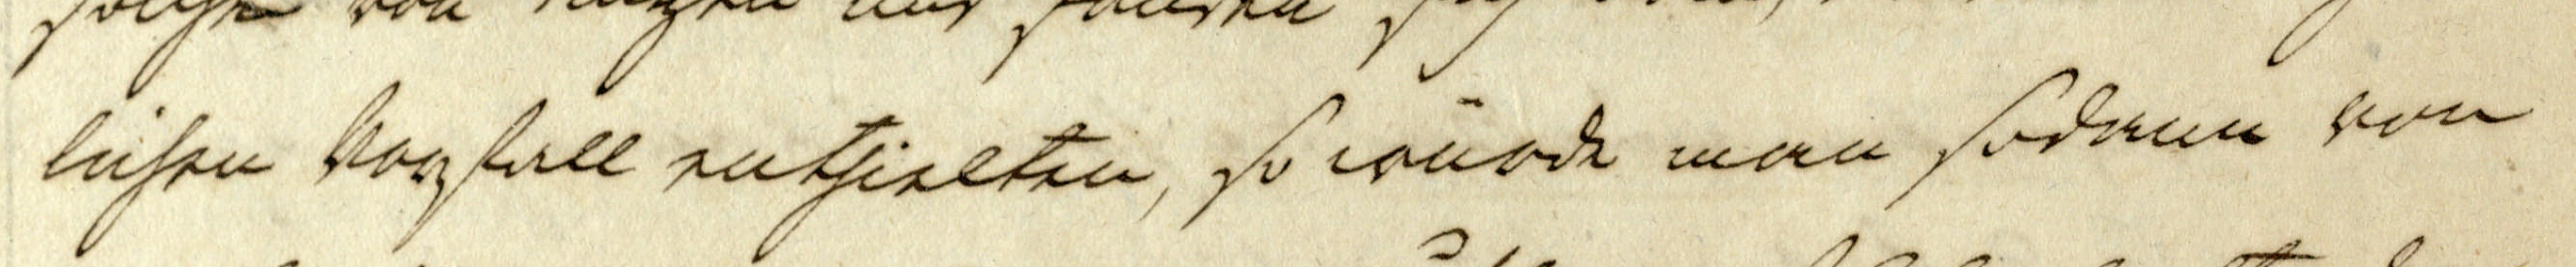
lichen Vorfall enthielten, so würde man sodann von
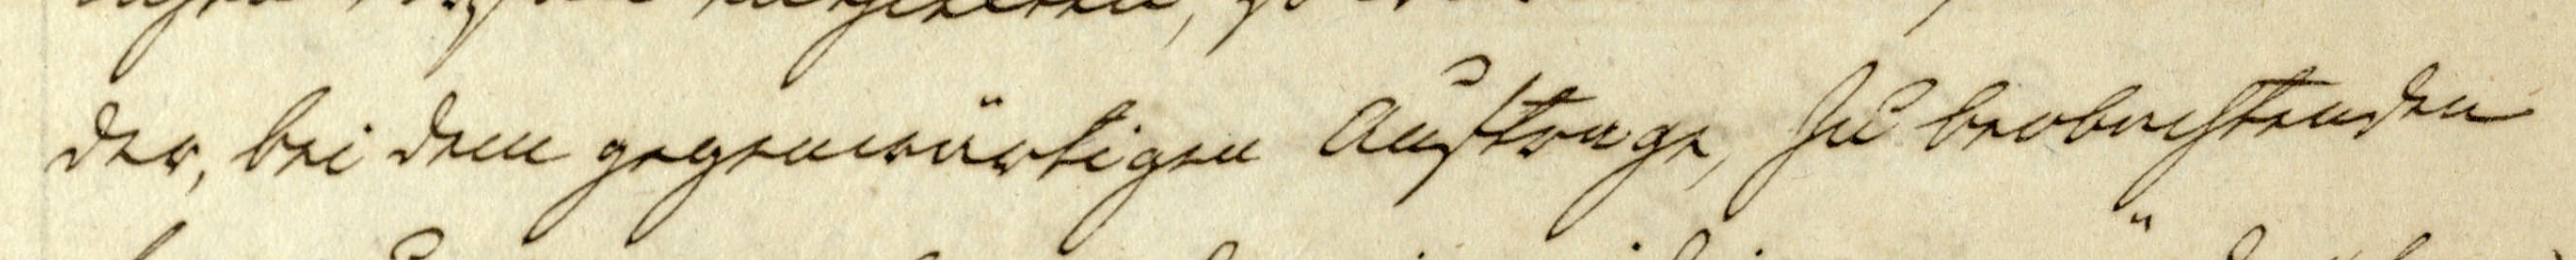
der, bei dem gegenwärtigen Auftrage zu beobachtenden
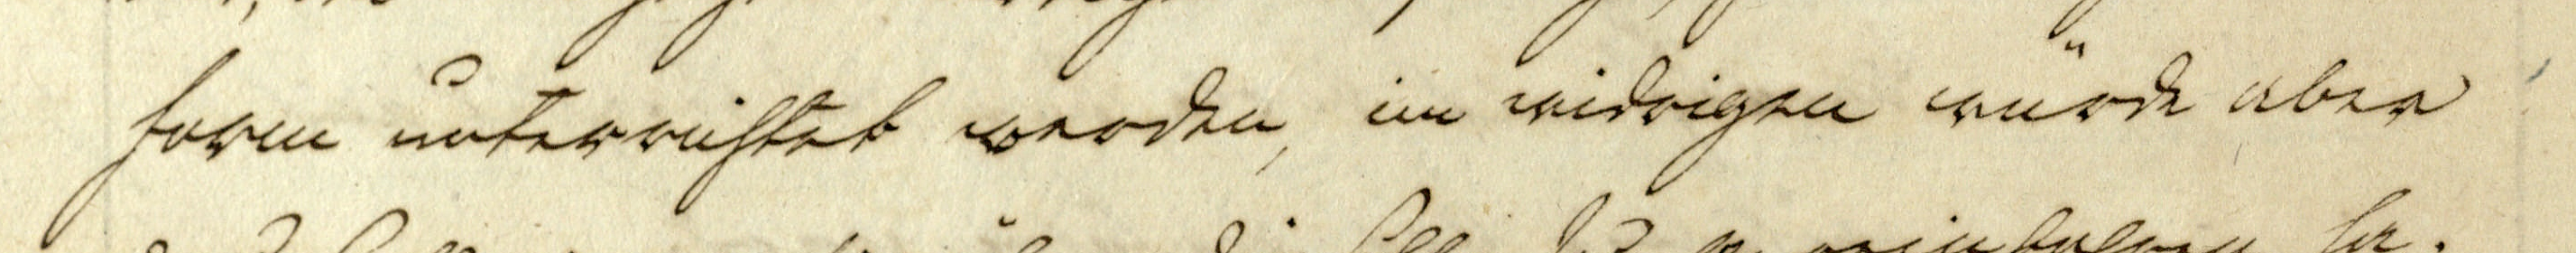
Form unterrichtet werden, im widrigen würde aber
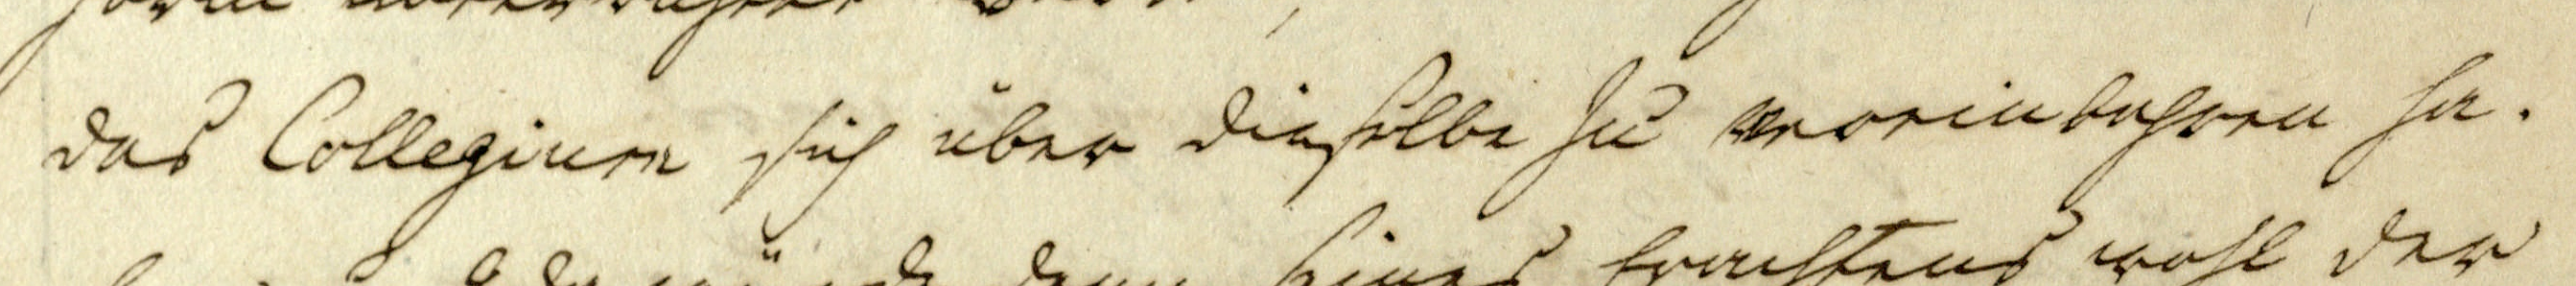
das Collegium sich über dieselbe zu vereinbahren ha¬
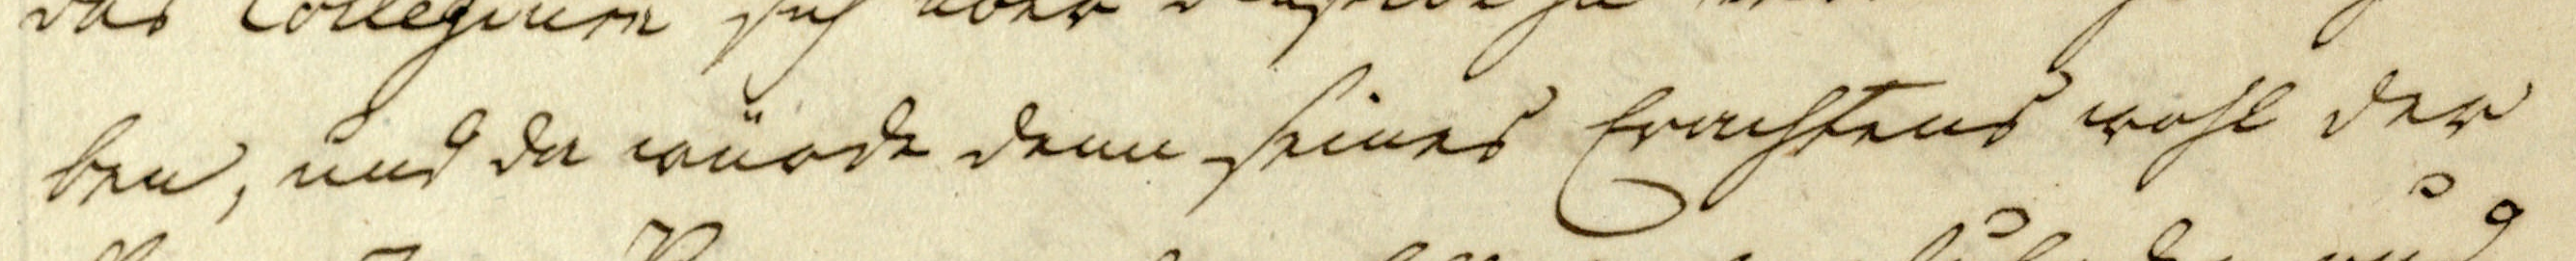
ben, und da würde denn seines Erachtens wohl der
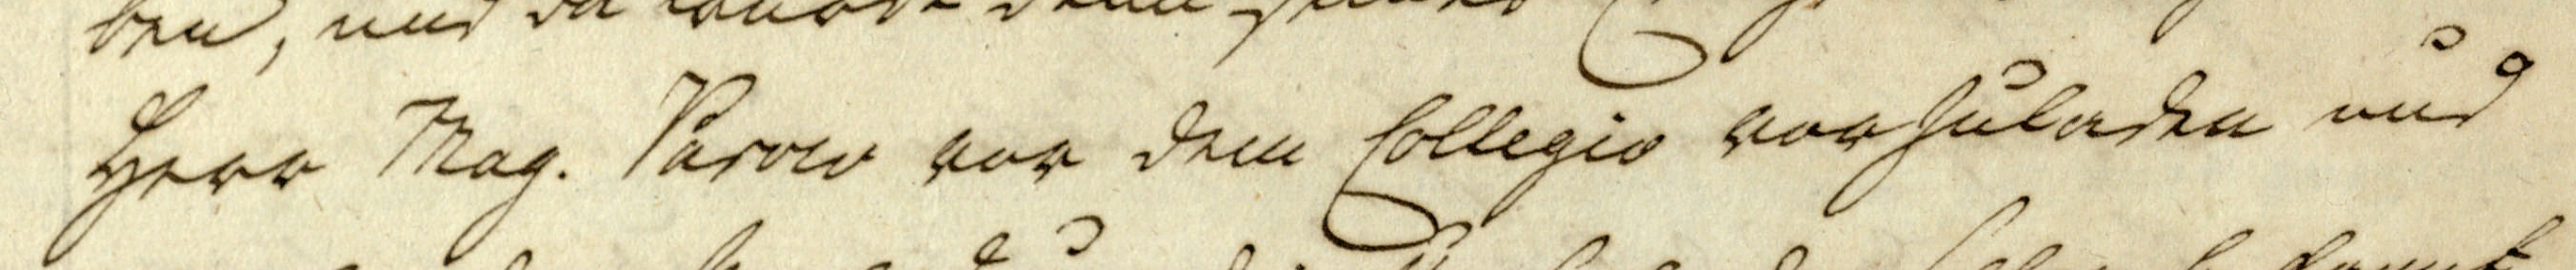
Herr Mag. Parow vor dem Collegio vorzuladen und
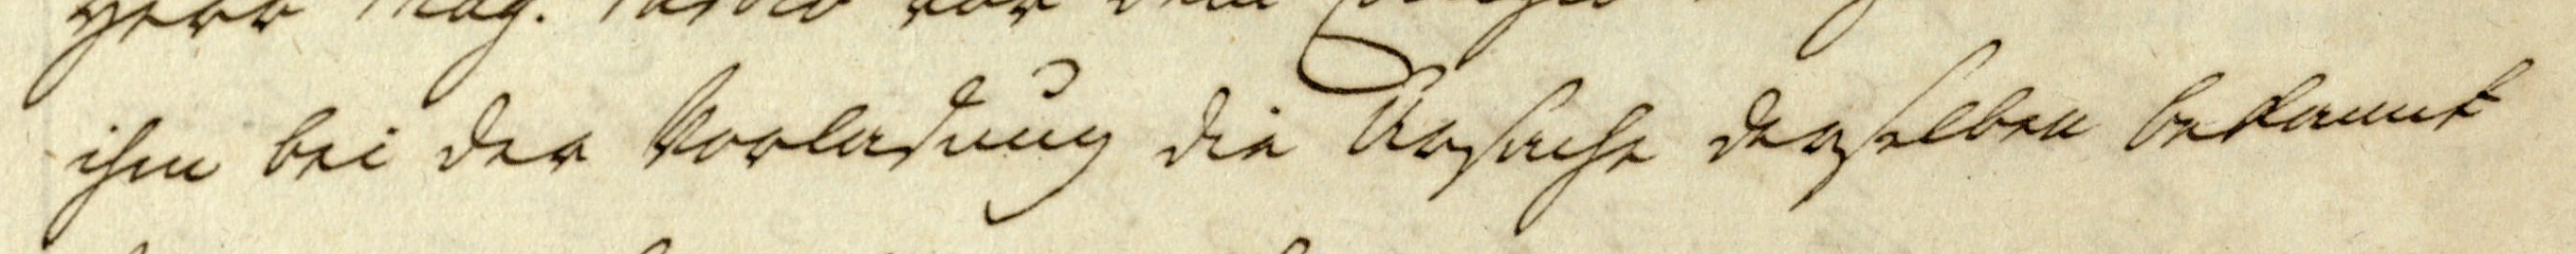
ihm bei der Vorladung die Ursache derselben bekannt
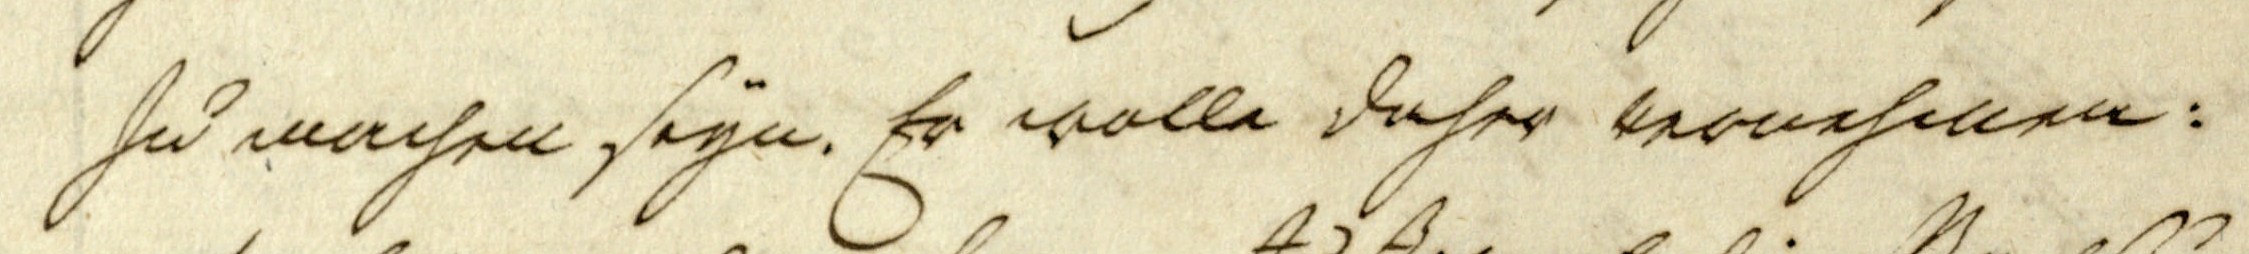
zu machen seÿn. Er wolle daher vernehmen:
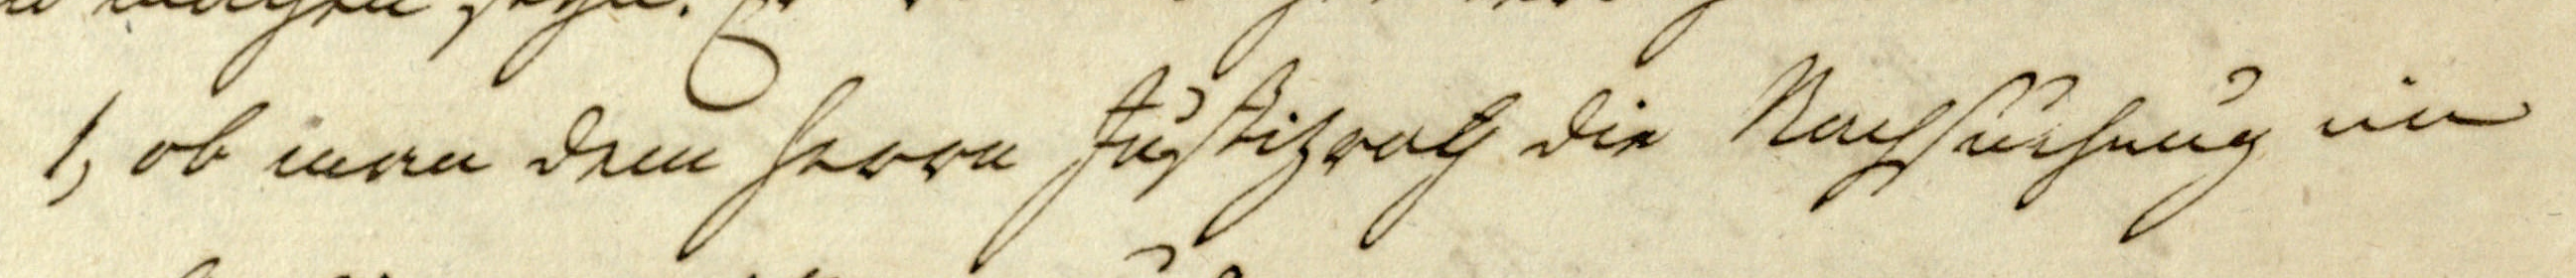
1, ob inan dem herrn Justizrath die Nachsuchung im
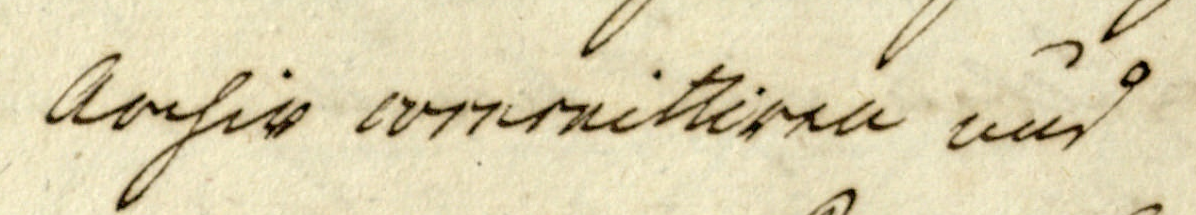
Archiv commitiren und
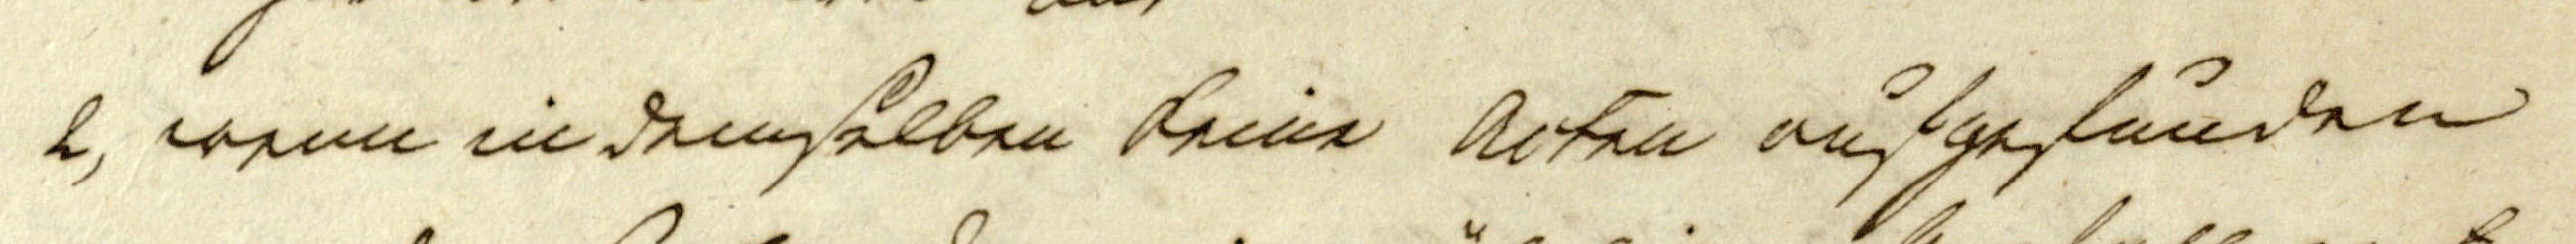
2, wenn in demselben keine Acten aufgefunden
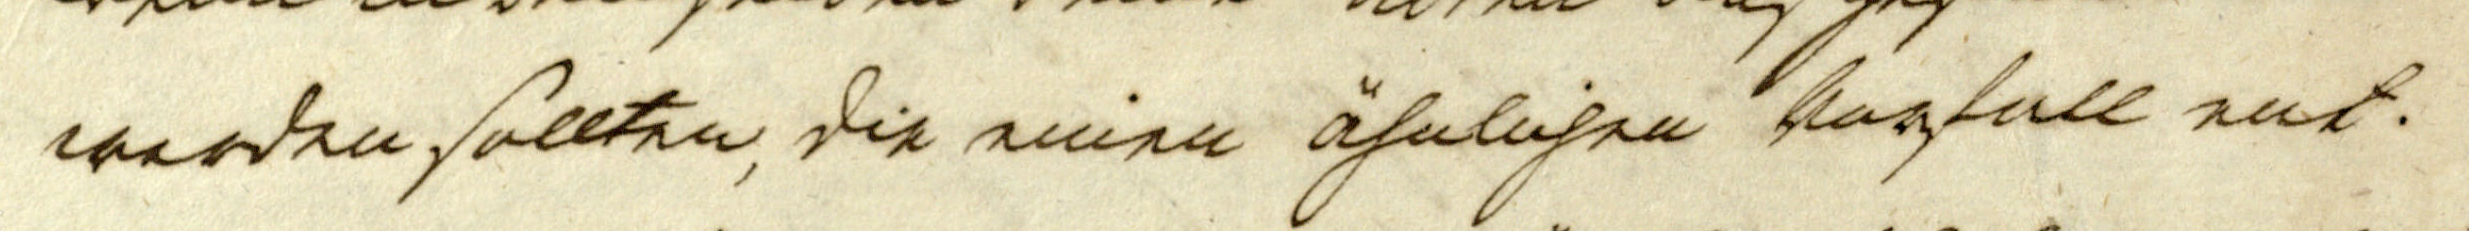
werden sollten, die einen ähnlichen Vorfall ent¬
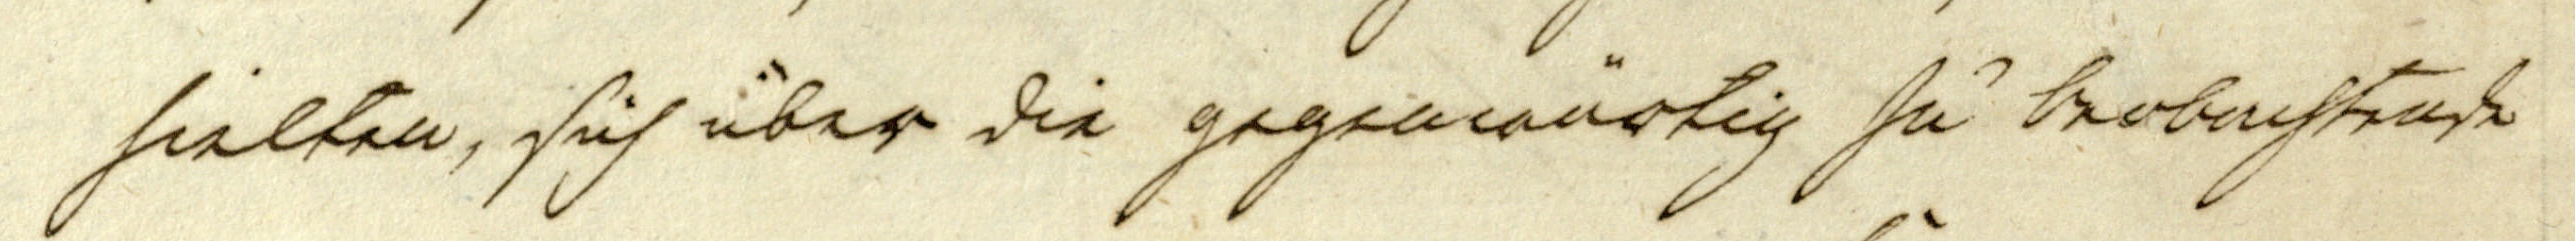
hielten, sich über die gegenwärtig zu beobachtende
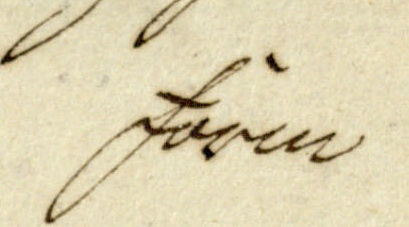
Form
